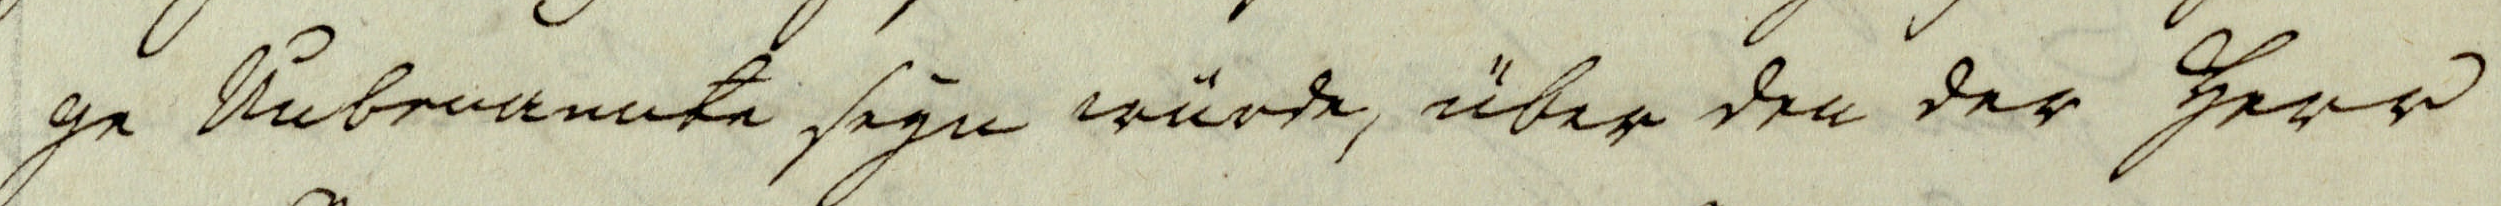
ge Unbenannte seÿn würde, über den der Herr
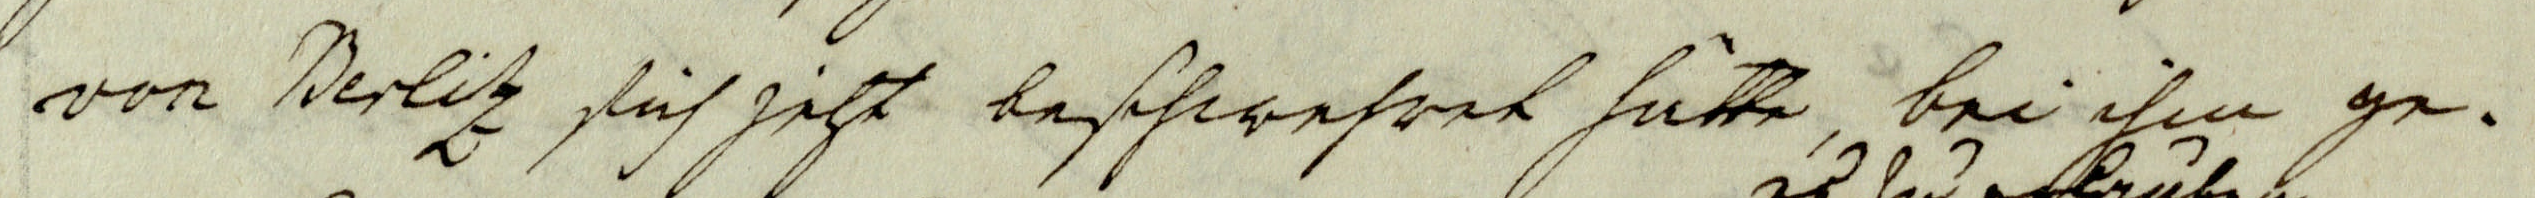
von Berlitz sich jetzt beschweret hätte, bei ihm ge¬
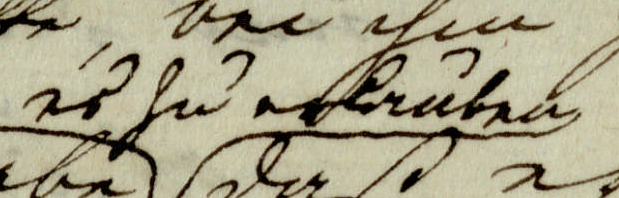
es zu erlauben,
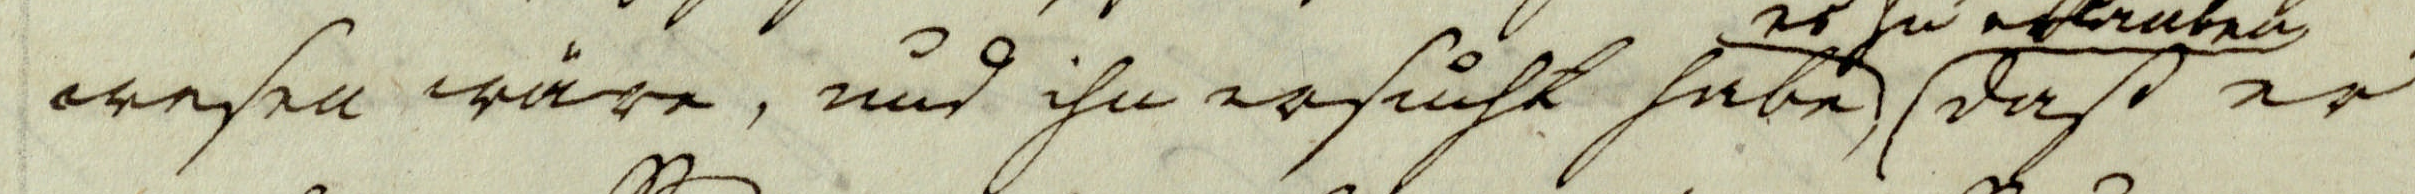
wesen wäre, und ihn ersucht habe, daß er
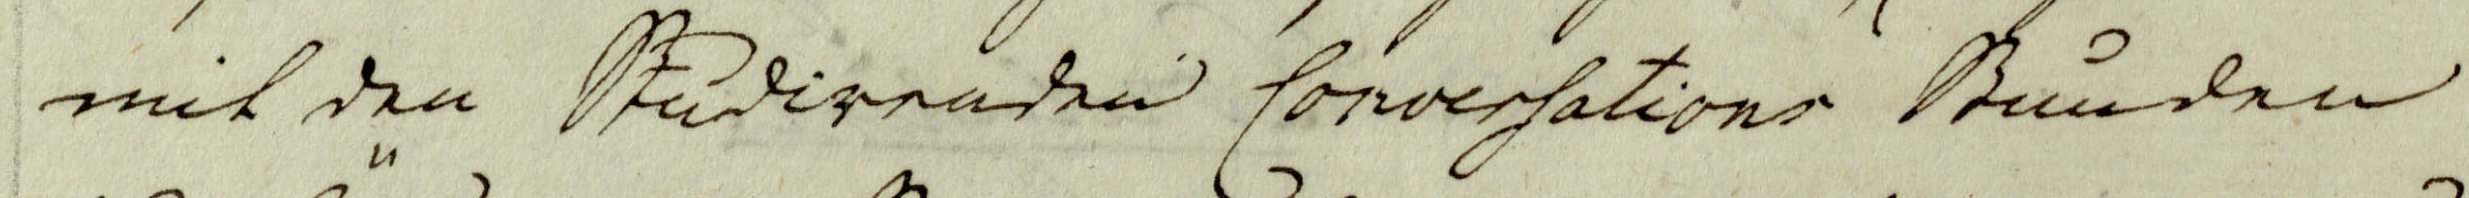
mit den Studirenden Conversations Stunden
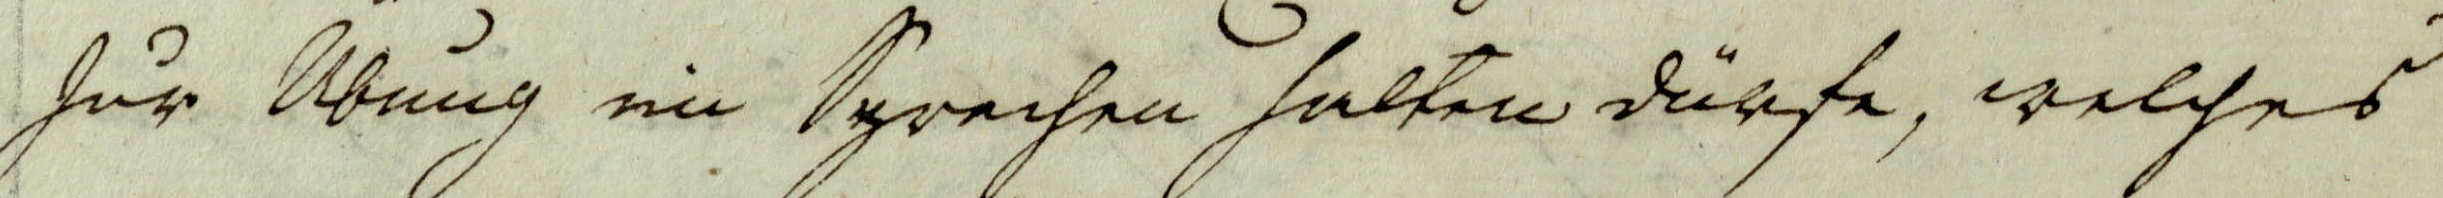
zur Übung im Sprechen halten dürfe, welches
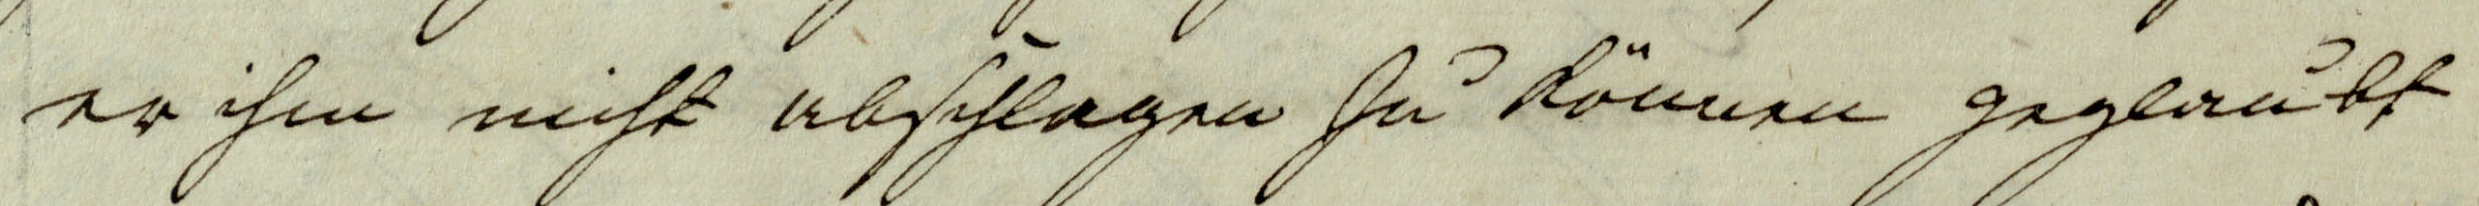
er ihm nicht abschlagen zu können geglaubt
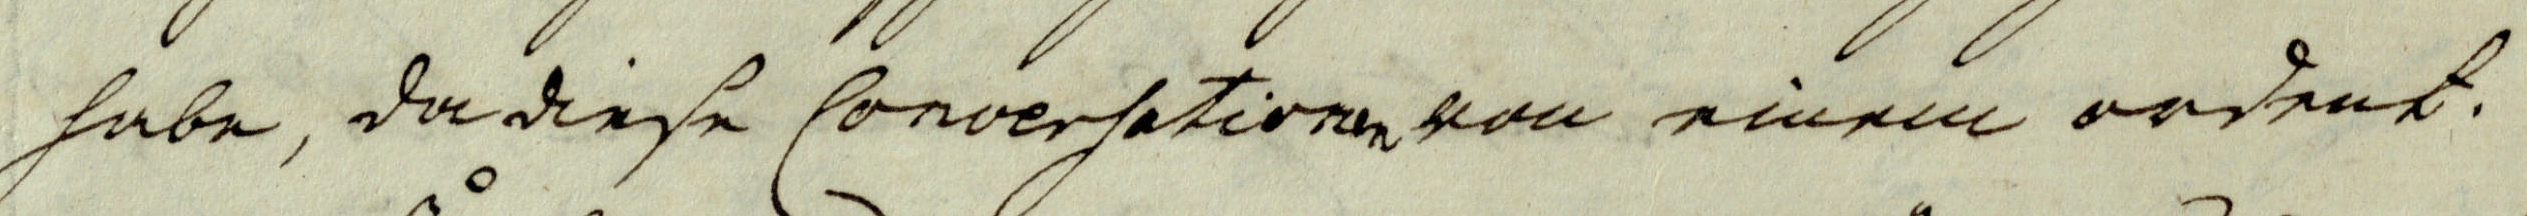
habe, da diese Conversationen von einem ordent¬
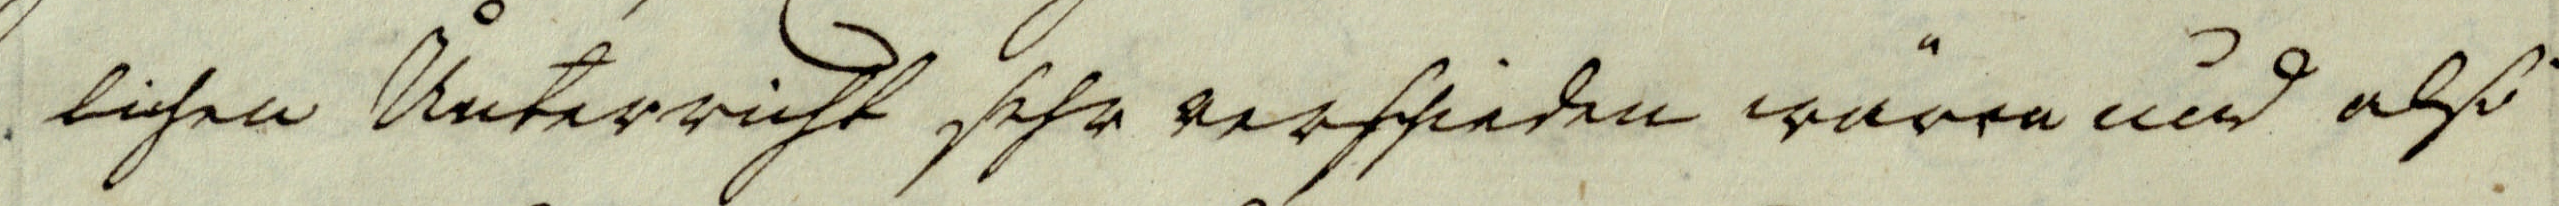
lichen Unterricht sehr verschieden wären und also
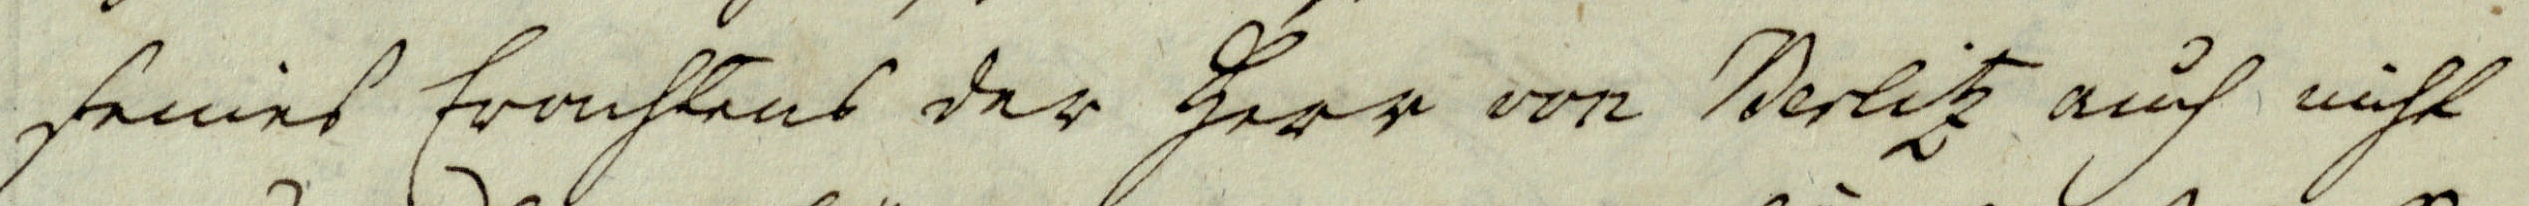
seines Erachtens der Herr von Berlitz auch nicht
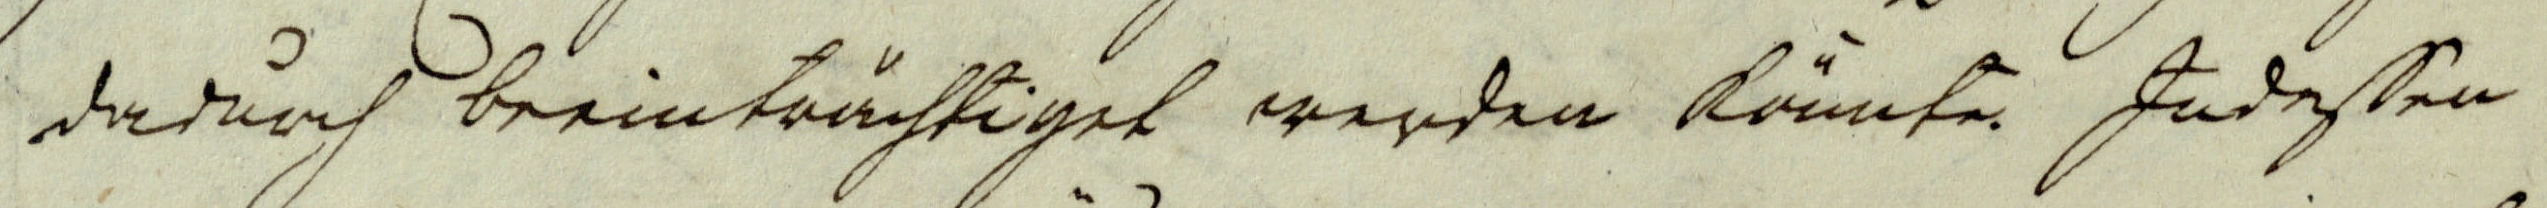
dadurch beeinträchtiget werden könnte. Indessen
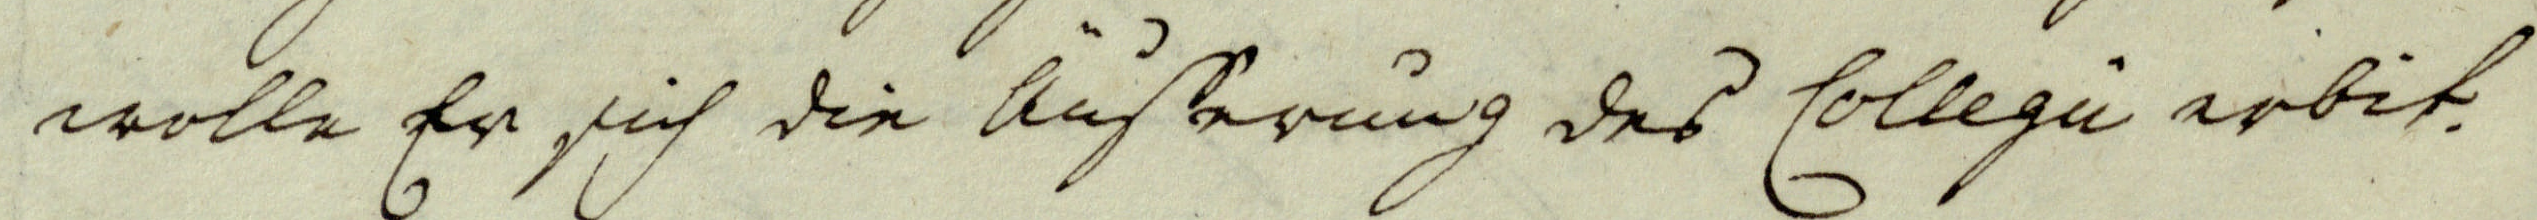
wolle Er sich die Äusserung des Collegii erbit¬
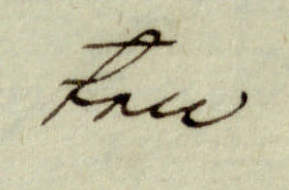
ten
